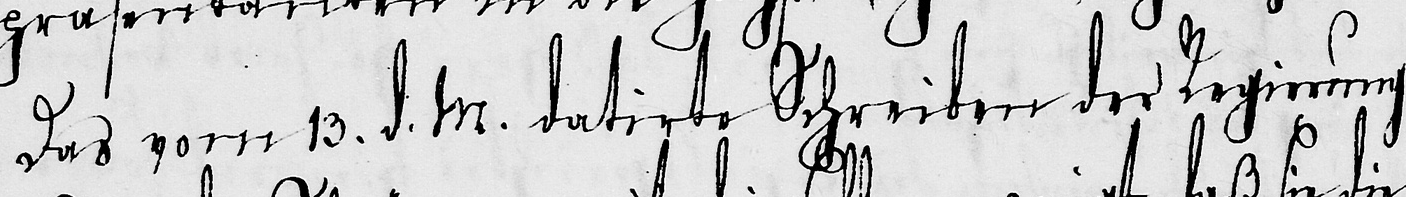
Das vom 13. d. M. datirte Schreiben der Regierung
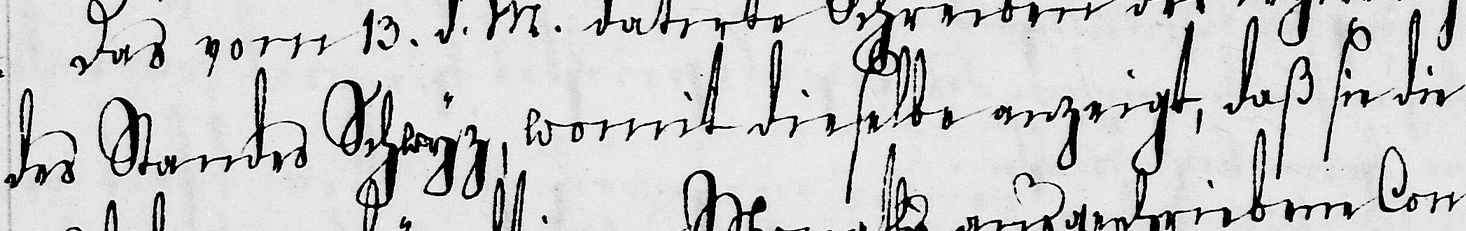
des Standes Schwyz, womit dieselbe anzeigt, daß sie die
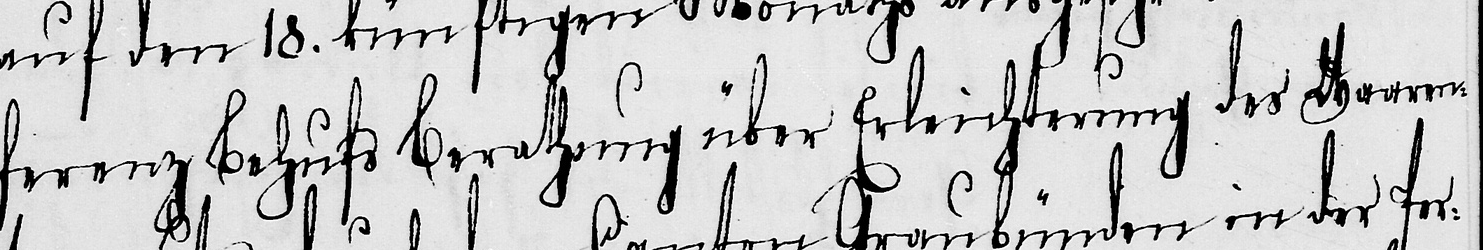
ferenz Behufs Berathung über Erleichterung des Waare¬
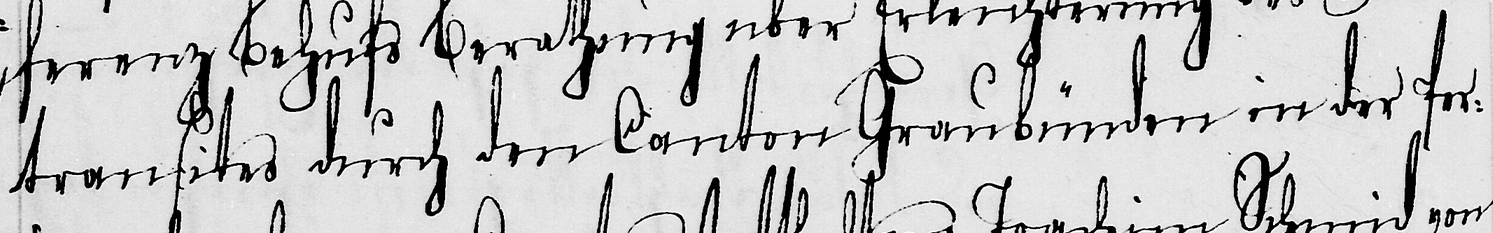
ntransites durch den Canton Graubünden in der Per¬
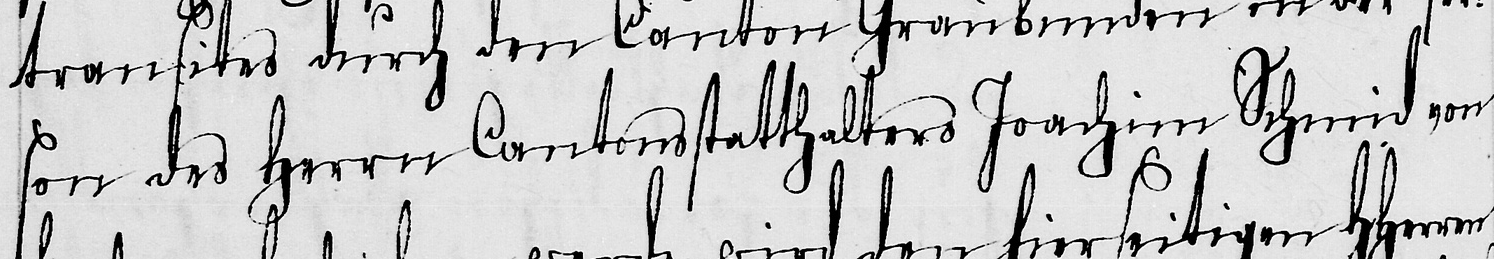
son des Herrn Cantonsstatthalters Joachim Schmid von
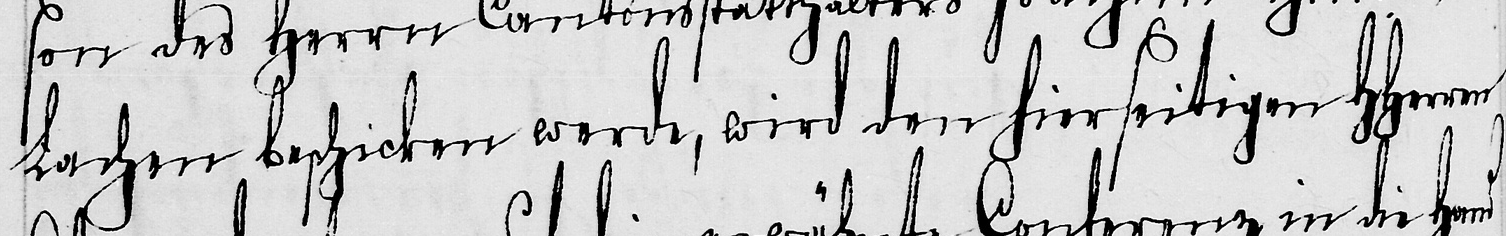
Lachen beschicken werde, wird den hierseitigen HHer¬
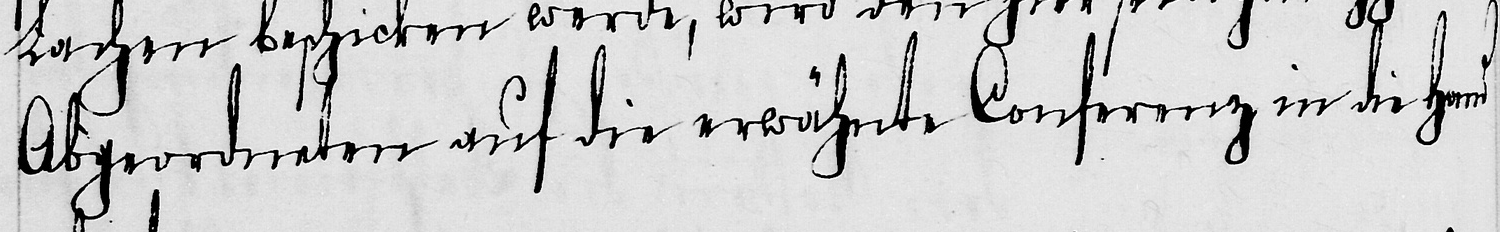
Abgeordneten auf die erwähnte Conferenz in die
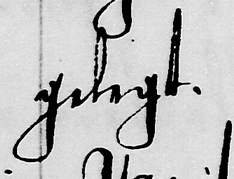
gelegt.
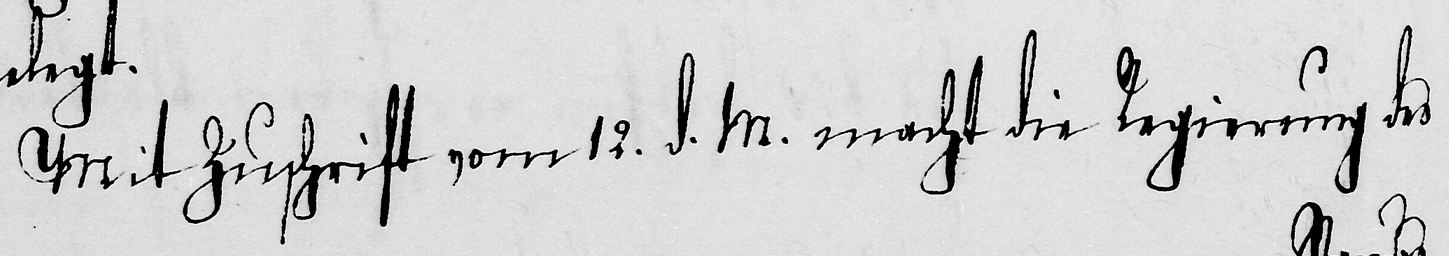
Mit Zuschrift vom 12. d. M. macht die Regierung des
